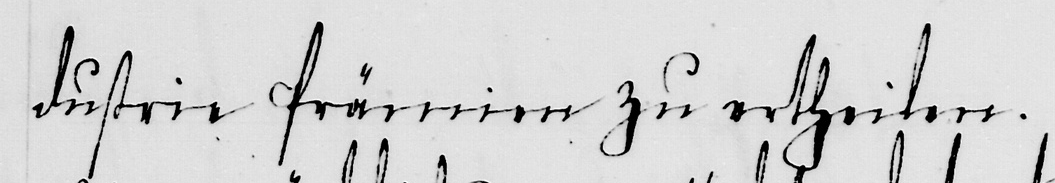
dustrie Prämien zu ertheilen.
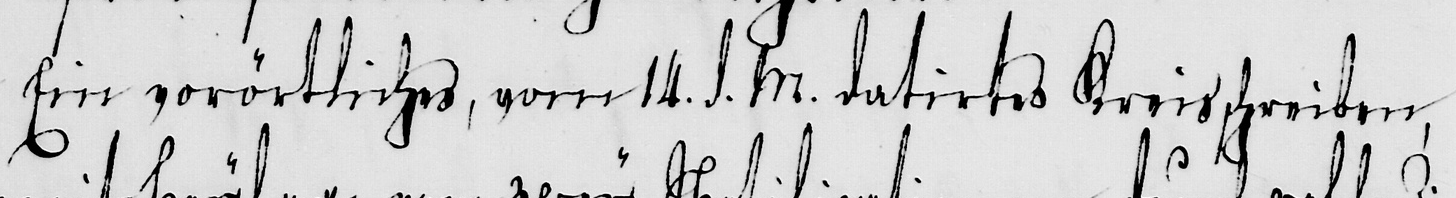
Ein vorörtliches, vom 14. d. M. datirtes Kreisschreiben,
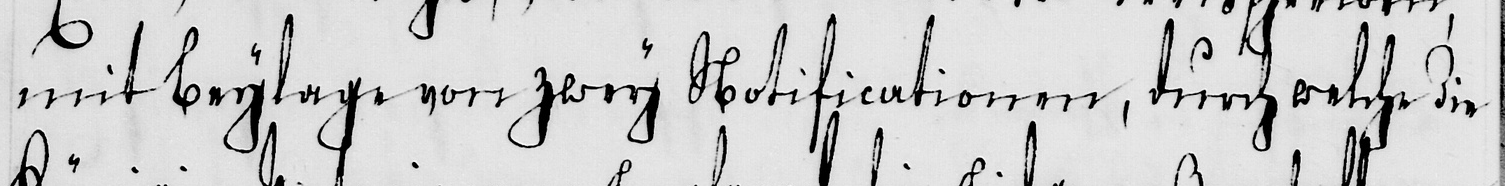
mit Beylage von zwey Notificationen, durch welche die
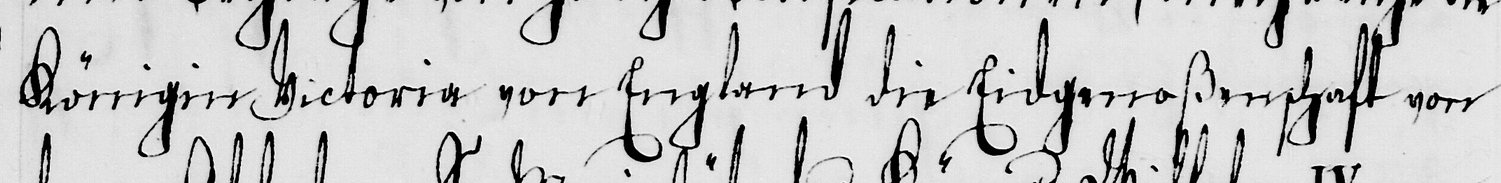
Königin Victoria von England die Eidgenoßenschaft von
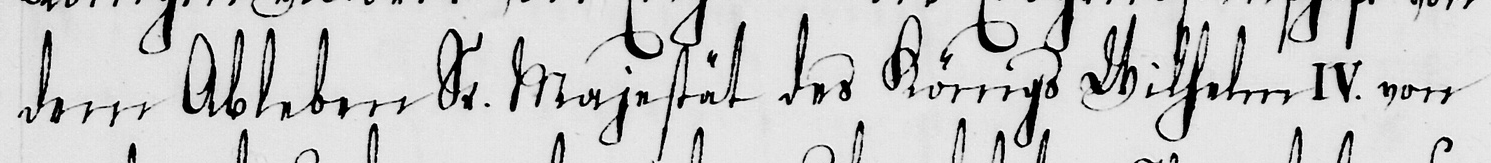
dem Ableben Sr. Majestät des Königs Wilhelm IV. von
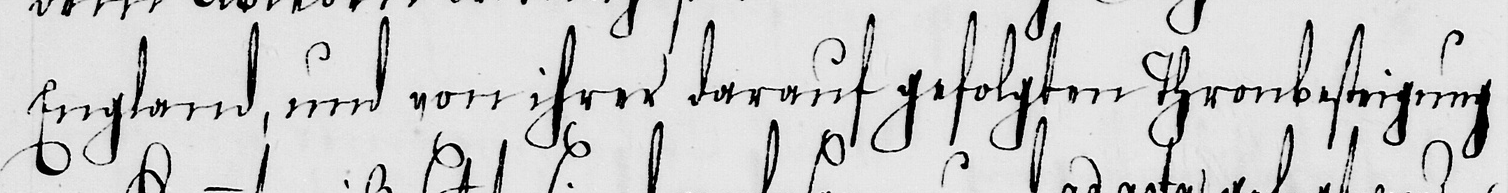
England, und von ihrer darauf gefolgten Thronbesteigung
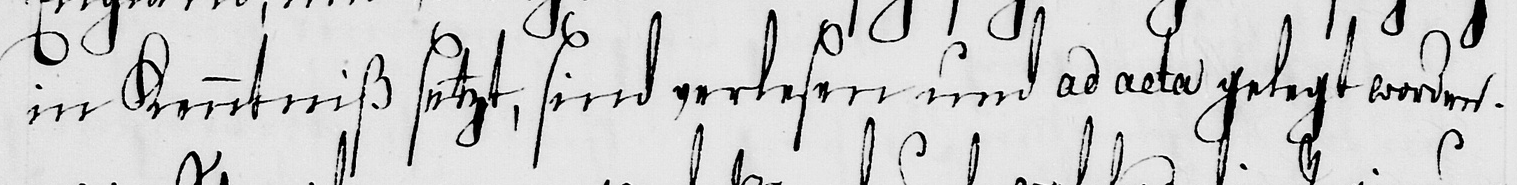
in Kenntniß setzt, sind verlesen und ad acta gelegt worden.
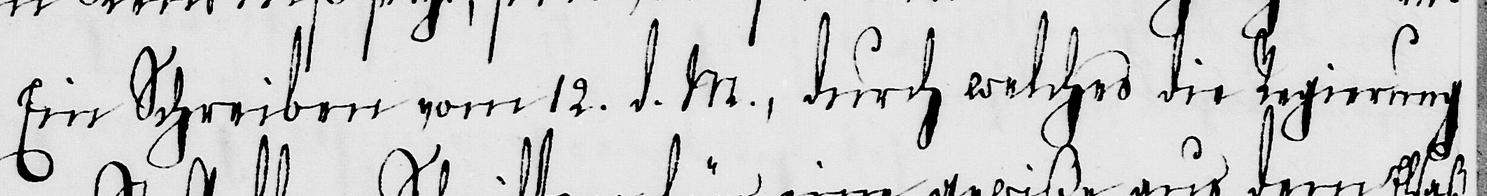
Ein Schreiben vom 12. d. M., durch welches die Regierung
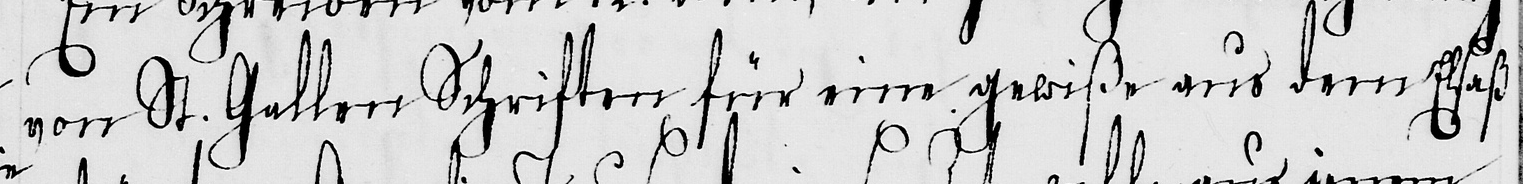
von St. Gallen Schriften für eine gewiße aus dem Elsaß
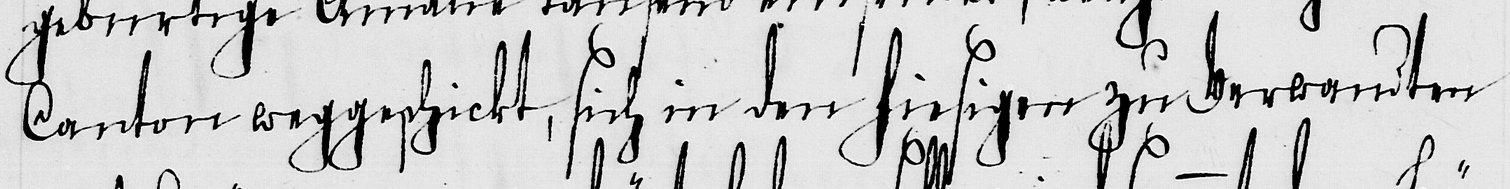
Canton weggeschickt, sich in den hiesigen zu Verwandten
